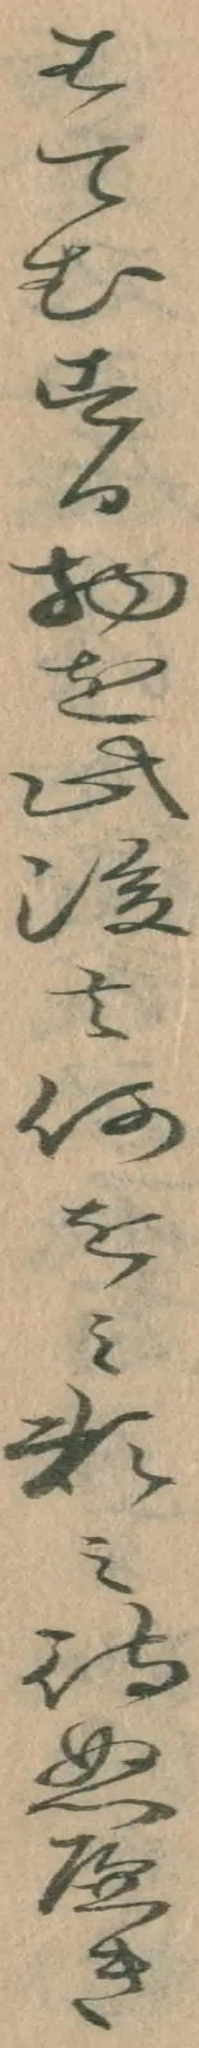はてむ春る物を此後者何をか頼み待怒屋き
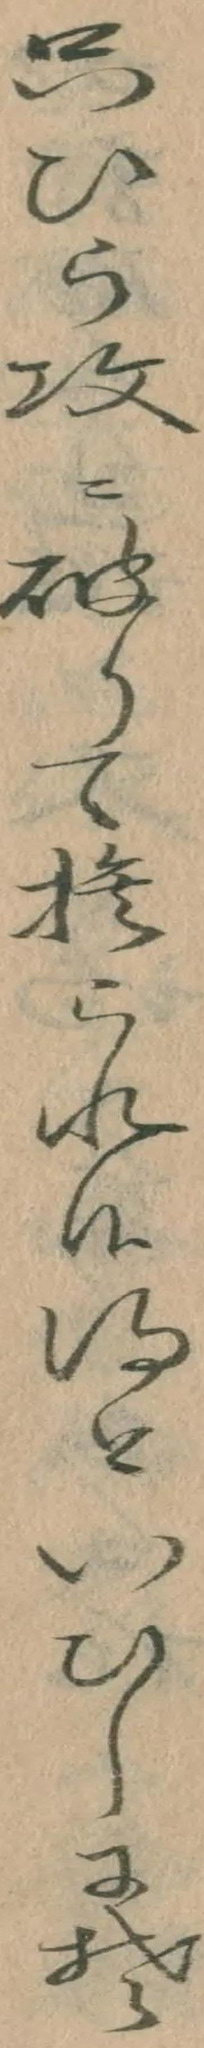只ひら攻に破りて捨られ候得といひし尓楚
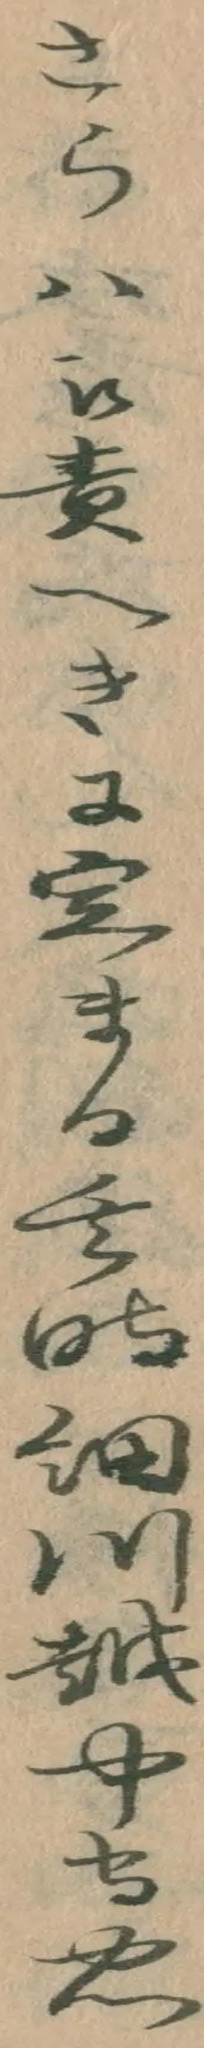さらは被責へき尓定まる其時細川越中守忠
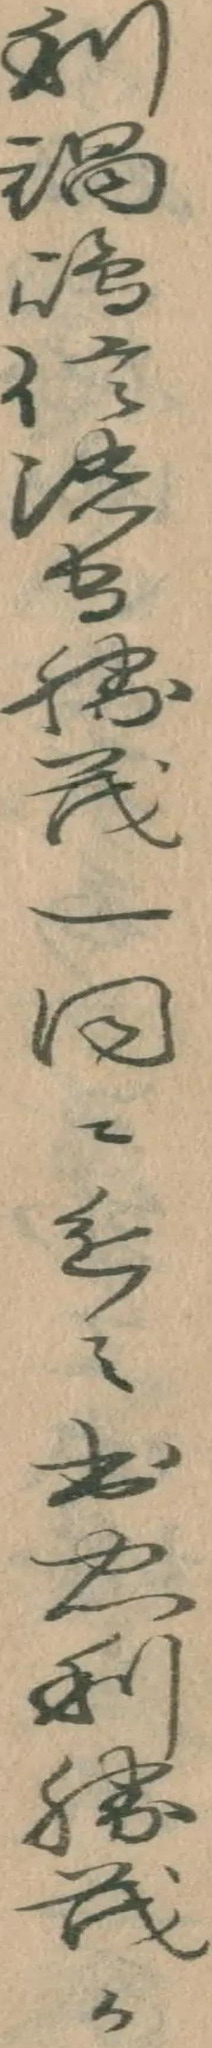利鍋島信濃守勝茂一同に進之出忠利勝茂か
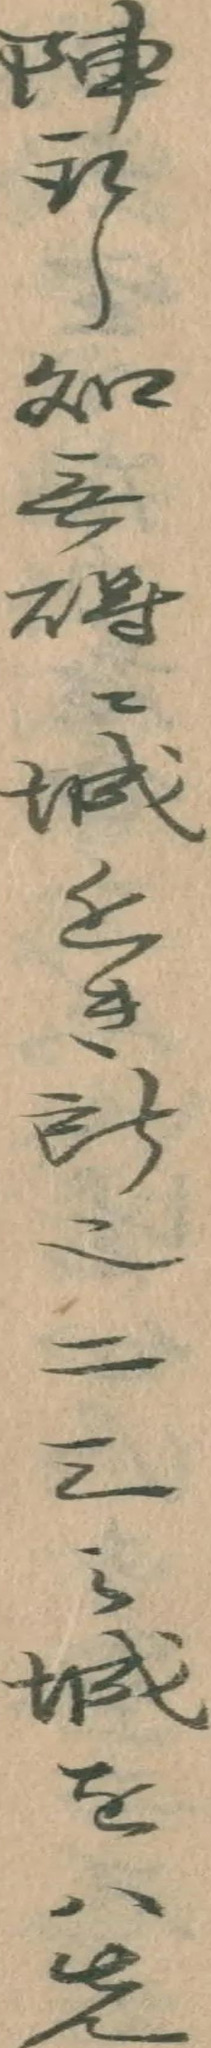陣取し処無碍に城近き所也二三之城をは先
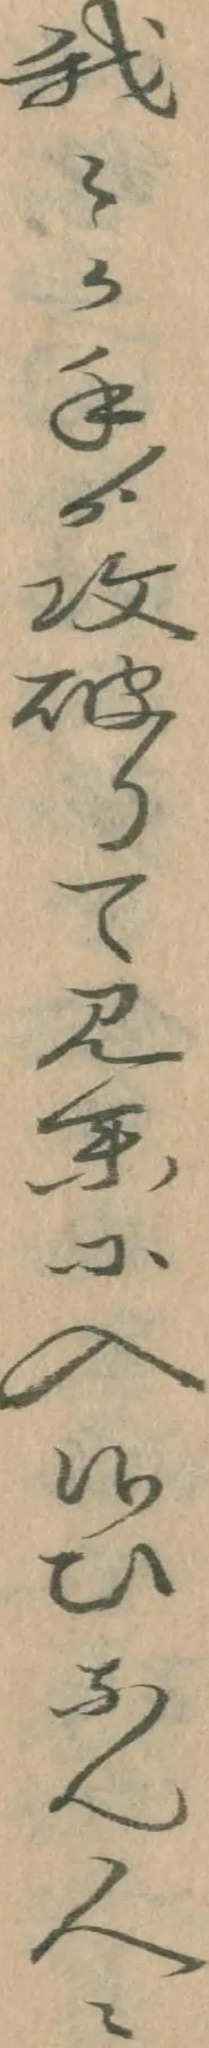我々か手ゟ攻破りて見参尓入候ひなん人に

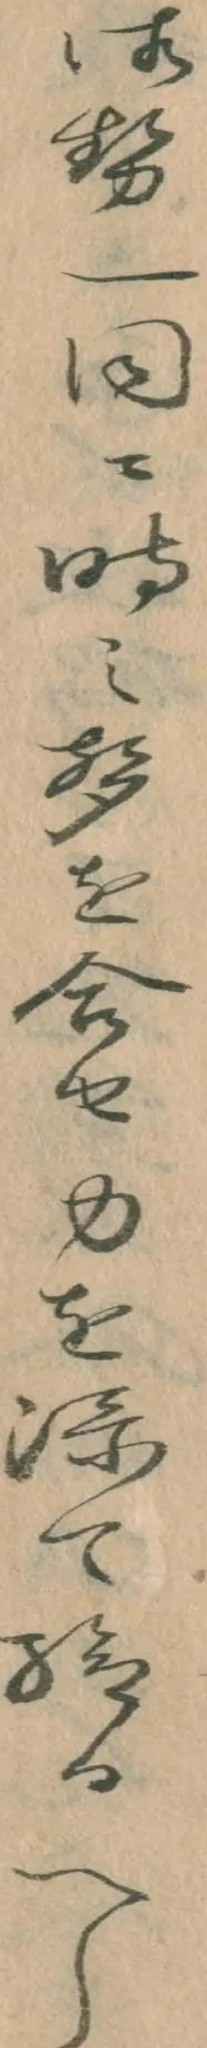御勢一同に時之声を合せ力を添て給るへし
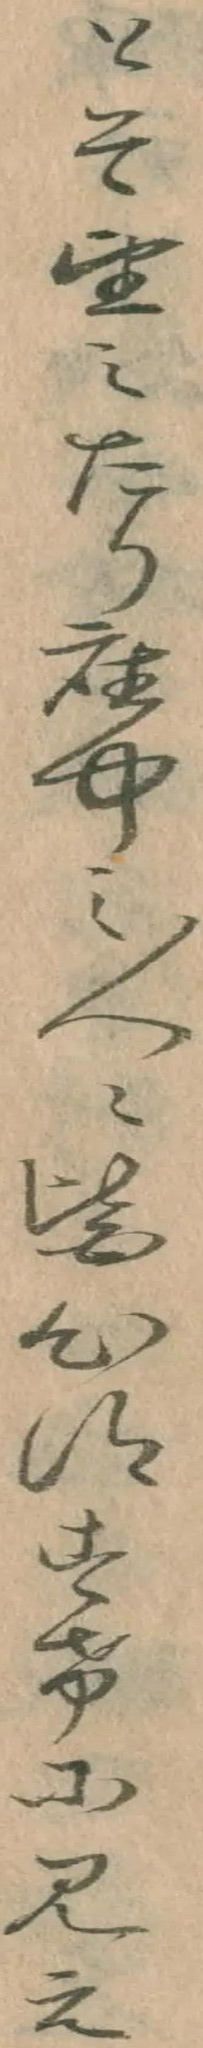とそ望之たり座中之人に皆心得春希等見え
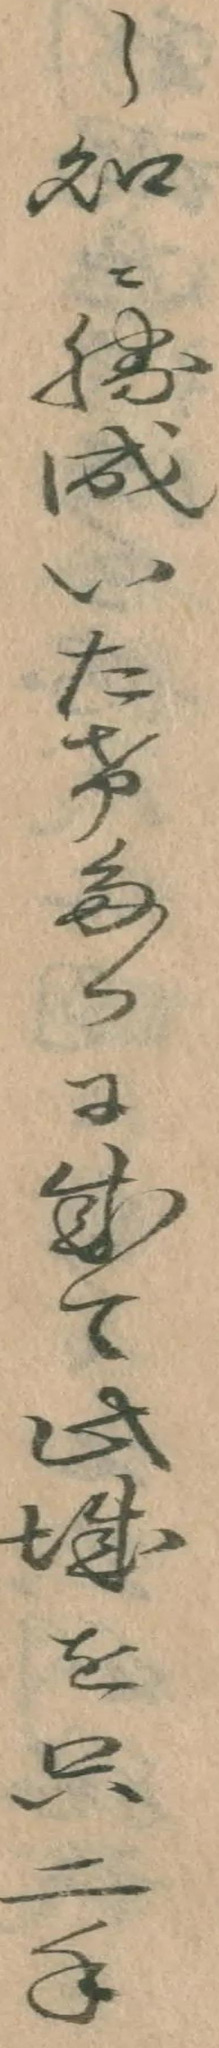し処に勝成いた希多か尓成て此城を只二手
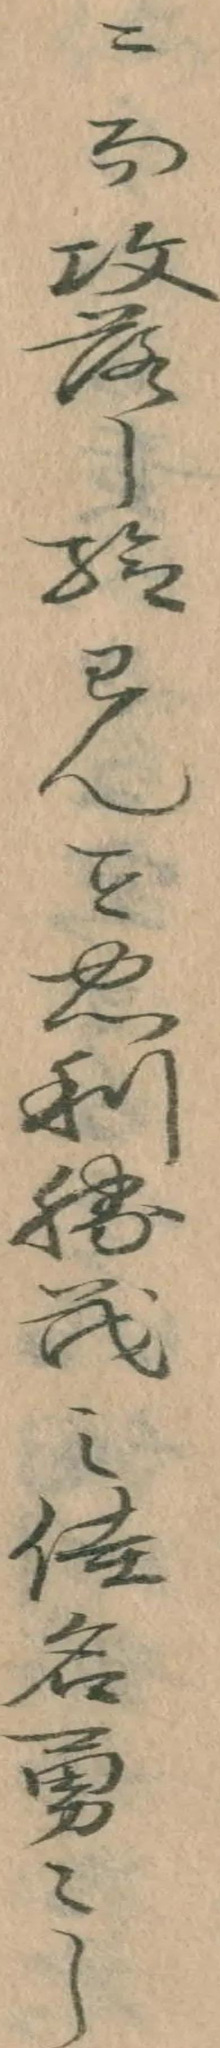に而攻落し給已んを忠利勝茂之佳名勇々し
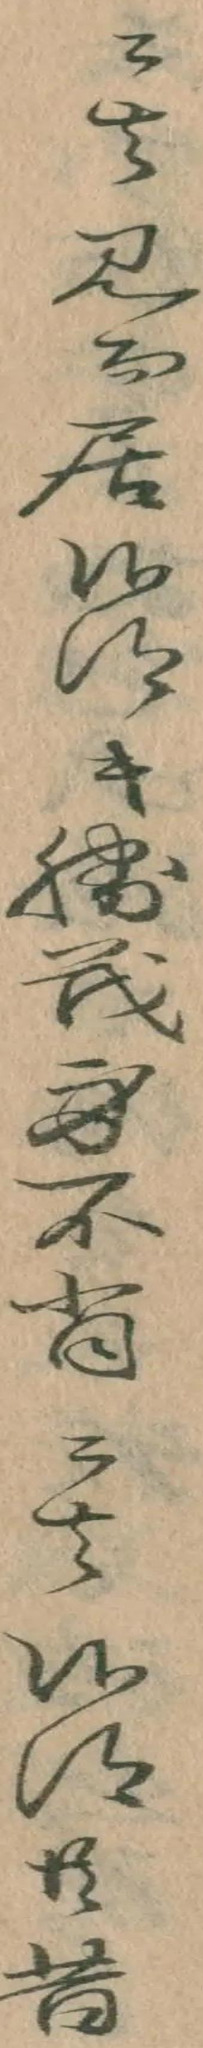に者見而居候得き勝茂身不背に者候得共昔
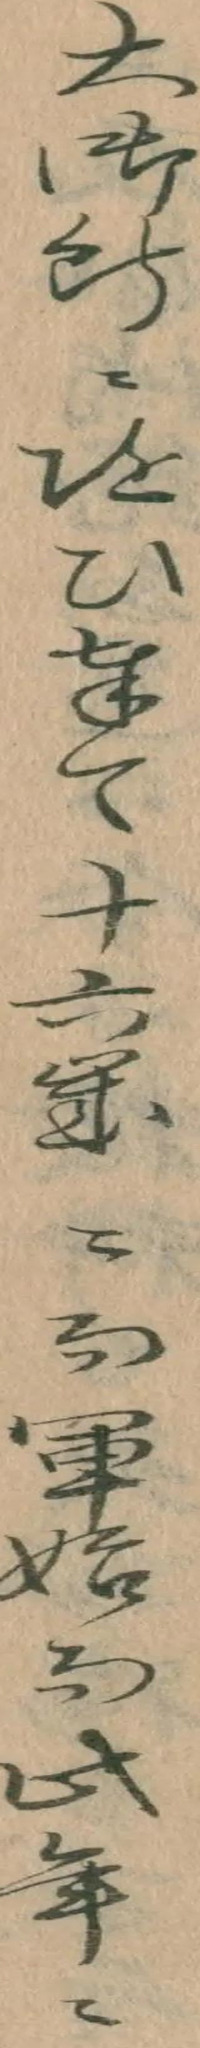大御所に随ひ奉て十六歳に而軍始而此年に
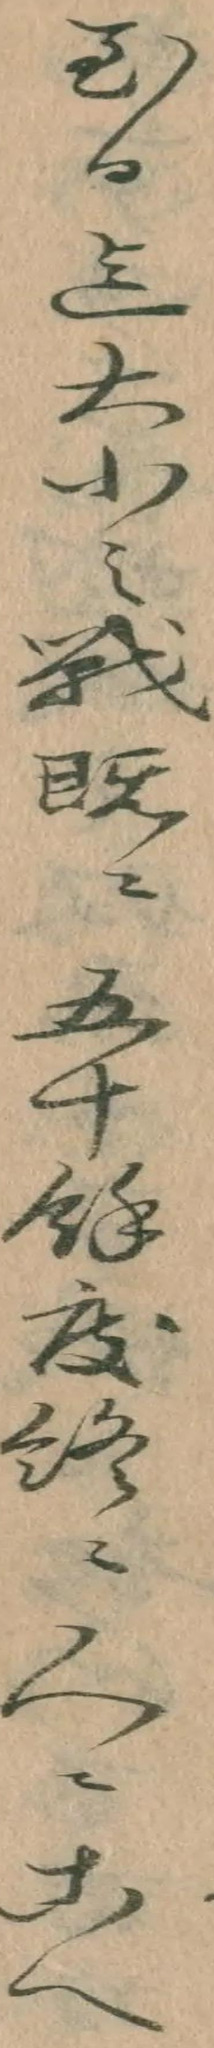至る迄大小之戦既に五十余度終に人に古へ
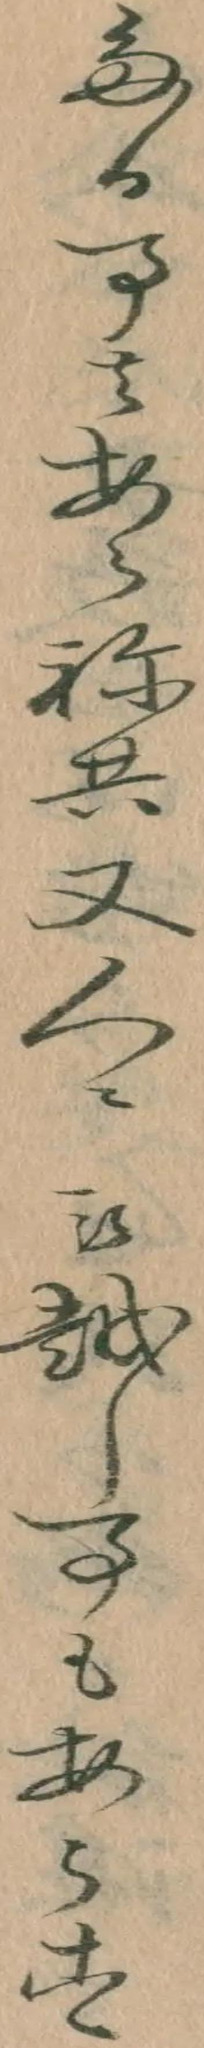多る事者あら祢共又人に被越し事もあら春
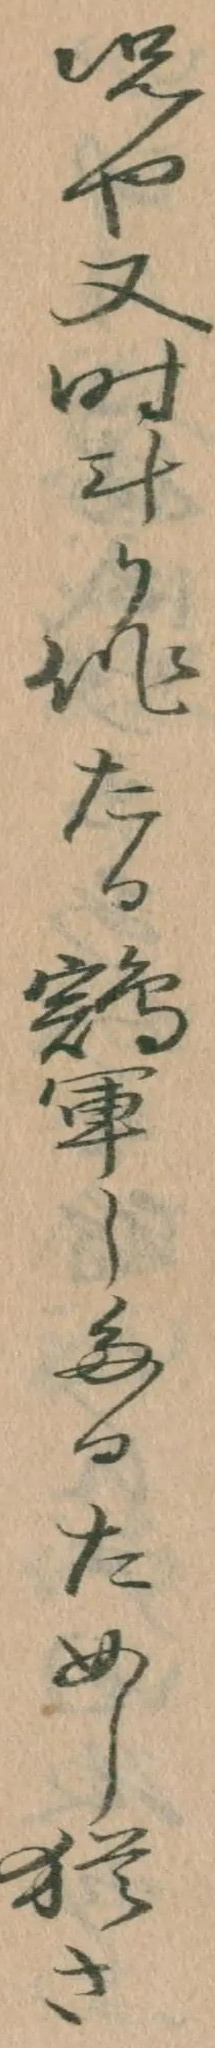況や又時斗り作たる鶏軍し多るためし猶さ
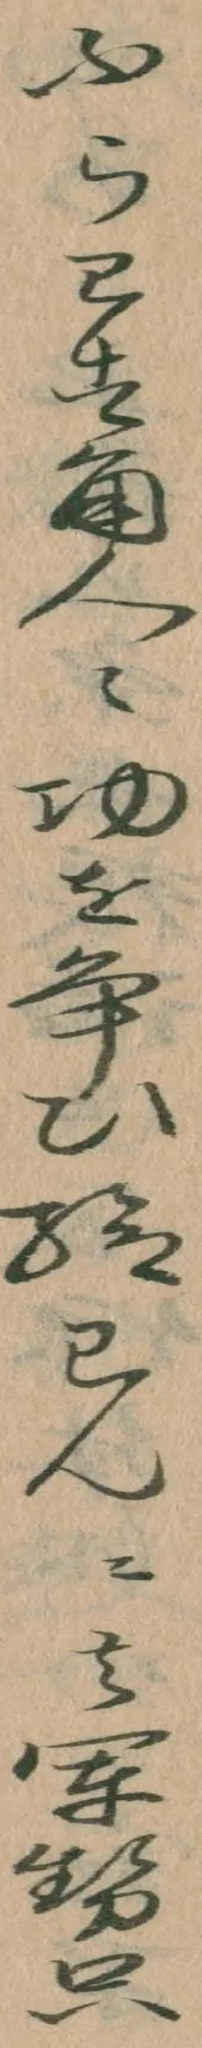ふら已春角人に功を争ひ給已んに者軍勢只
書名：切支丹御退治記 49巻. [7]
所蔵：国立国会図書館 National Diet Library, JAPAN
